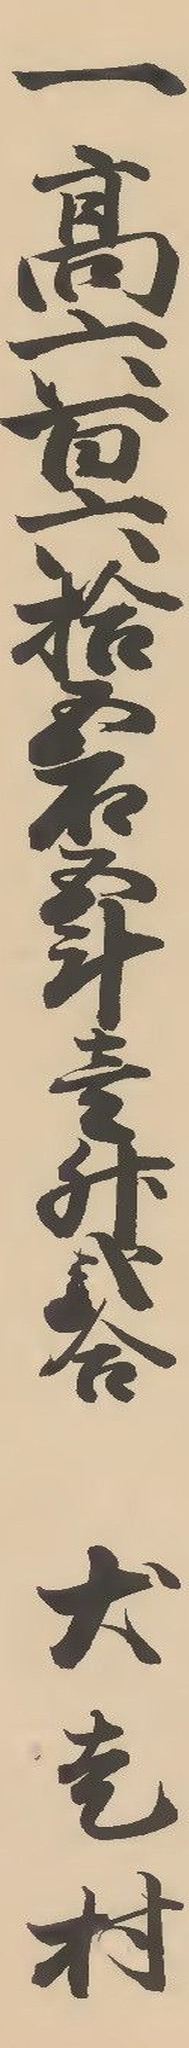一髙六百六拾五石五斗壱升弐合犬走村
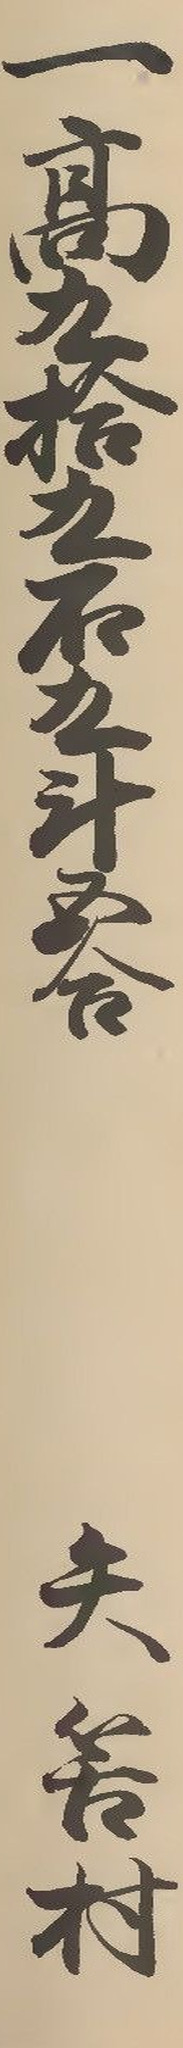一髙九拾九石九斗五合矢筈村
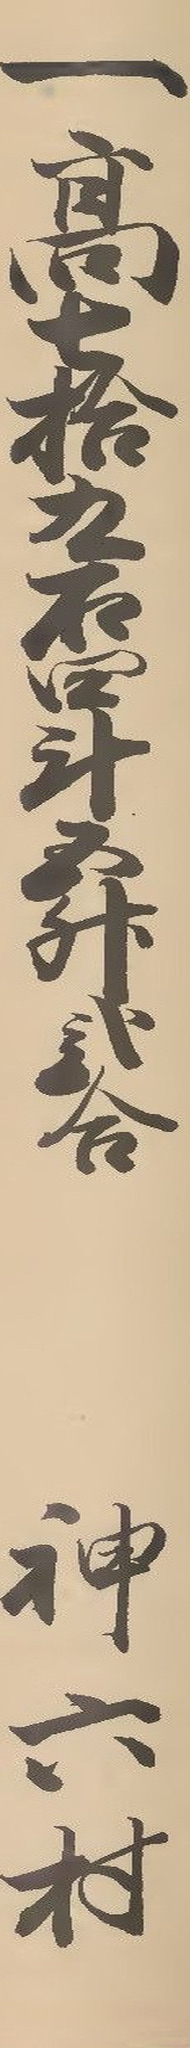一髙七拾九石四斗五升弐合神六村
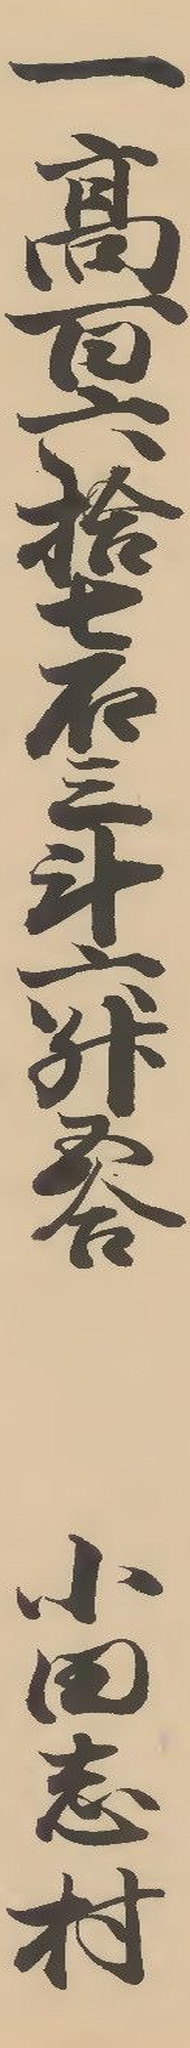一髙百六拾七石三斗六升五合小田志村
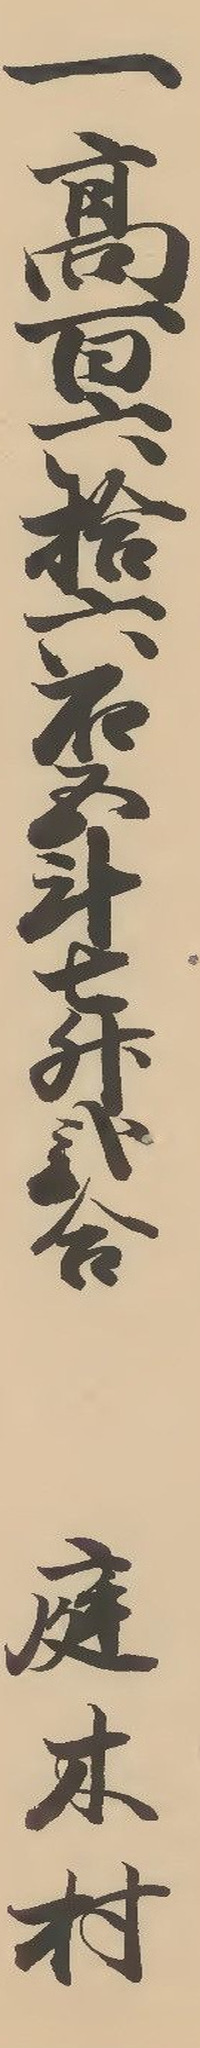一髙百六拾六石五斗七升弐合庭木村
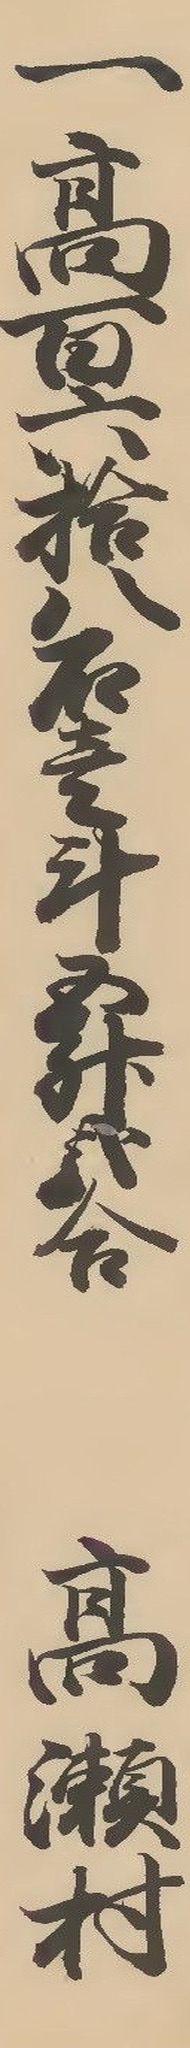一髙百六拾八石壱斗五升弐合高瀬村

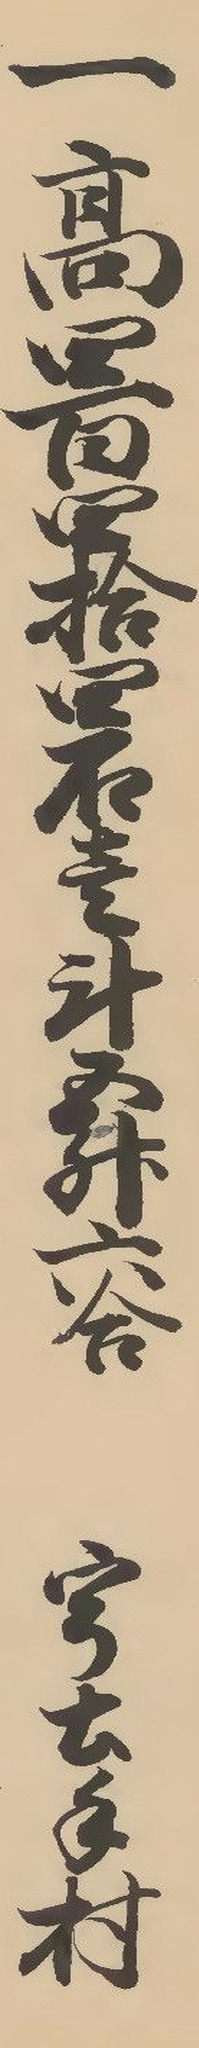一髙四百四拾四石壱斗五升六合宇土手村
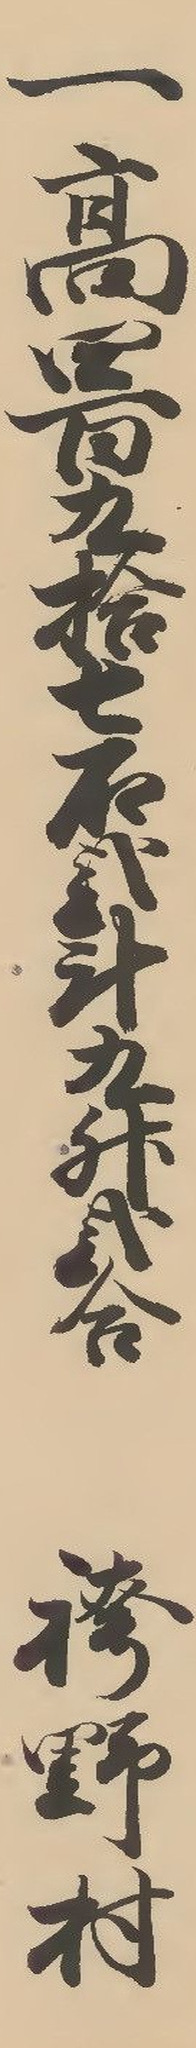一髙四百九拾七石弐斗九升弐合袴野村
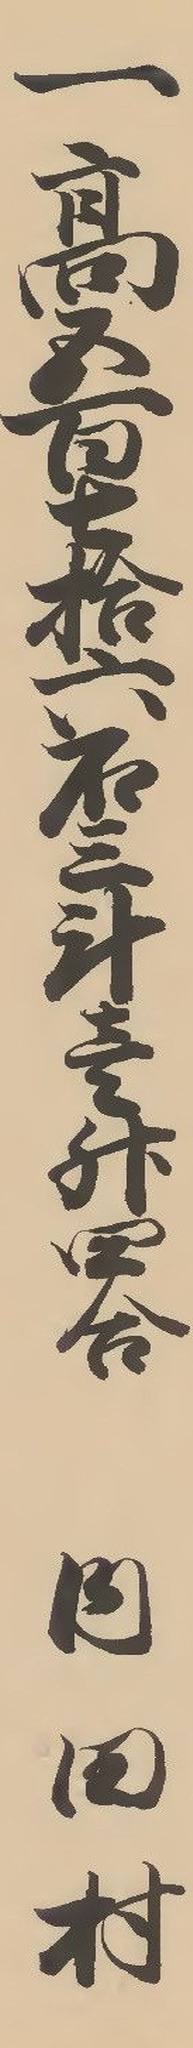一髙五百七拾六石三斗壱升四合内田村
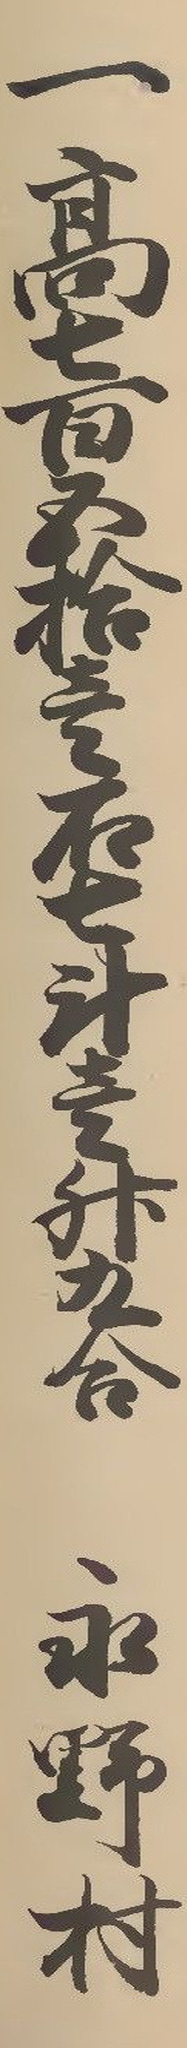一髙七百五拾壱石七斗壱升九合永野村
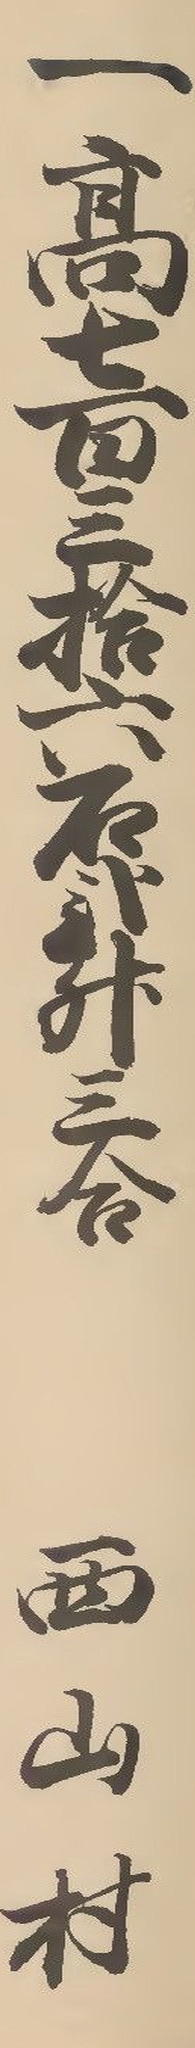一髙七百三拾六石弐升三合西山村
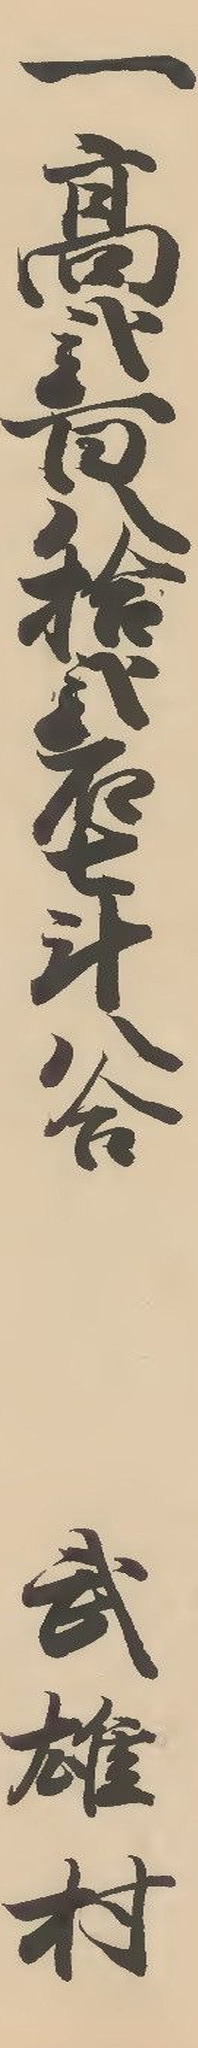一髙弐百八拾弐石七斗八合武雄村
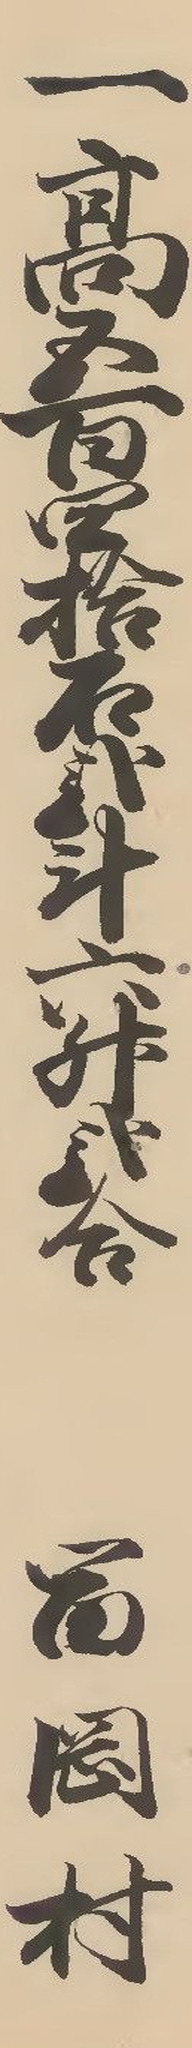一髙五百四拾石弐斗六升弐合冨岡村
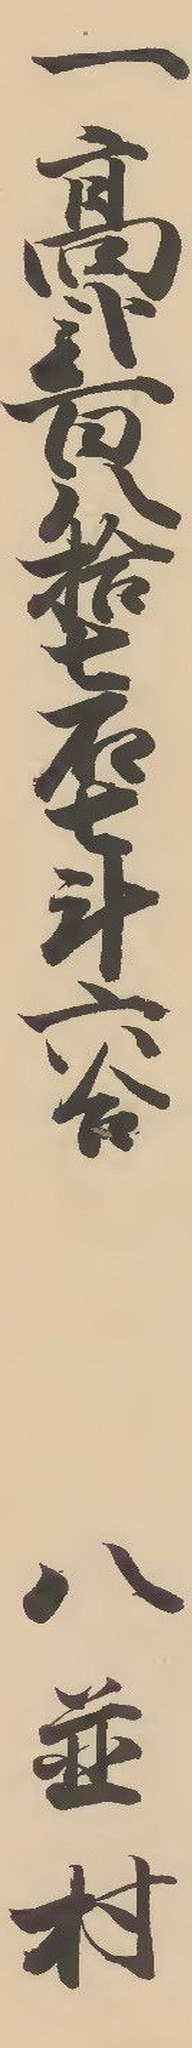一髙弐百八拾七石七斗六合八並村

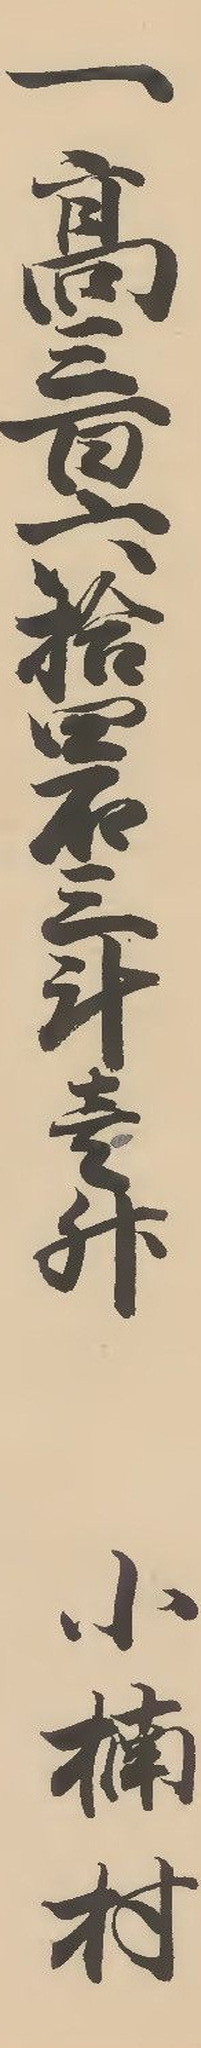一髙三百六拾四石三斗壱升小楠村
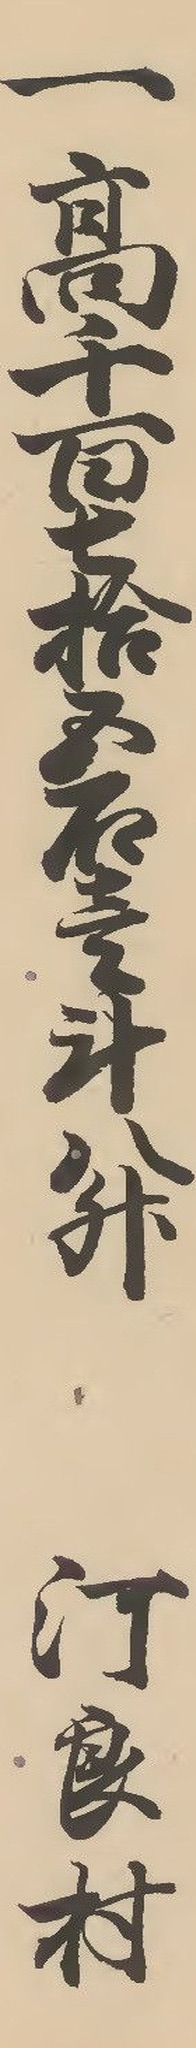一髙千百七拾五石壱斗八升河良村
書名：肥前国郷帳
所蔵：国立公文書館 National Archives of Japan
